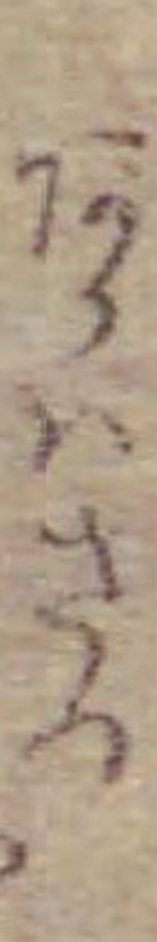あらはさつ

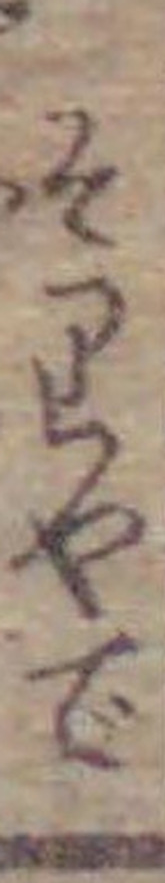そりやで
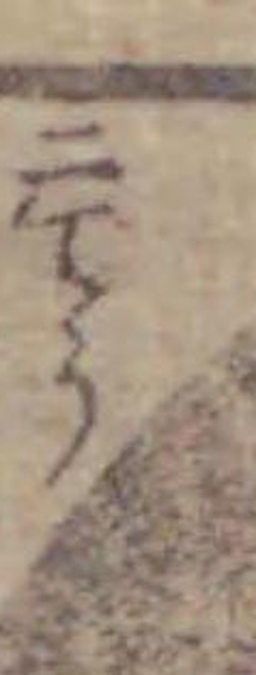二てう
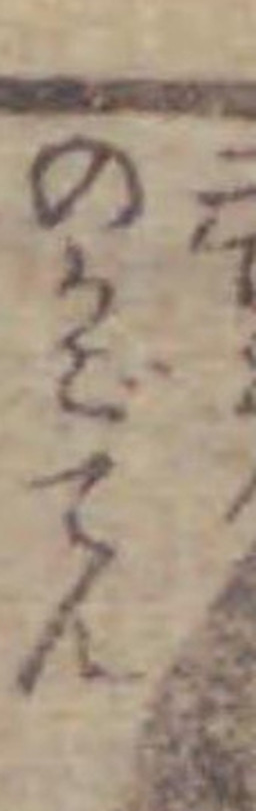のかごてん
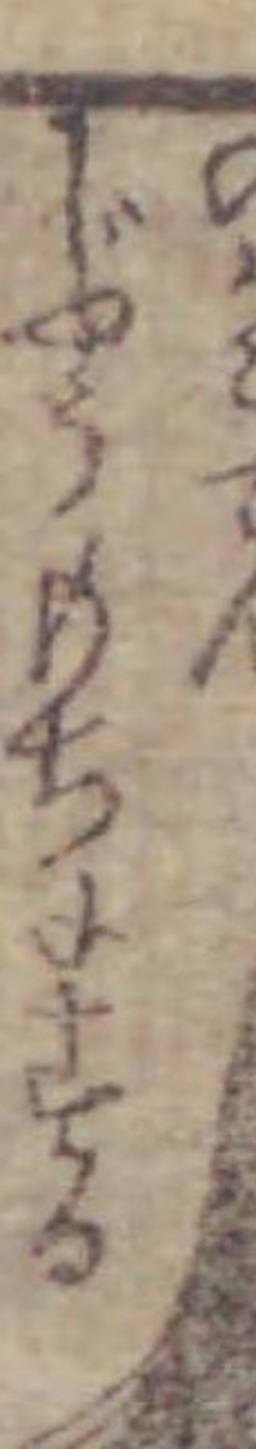じやうもちにする
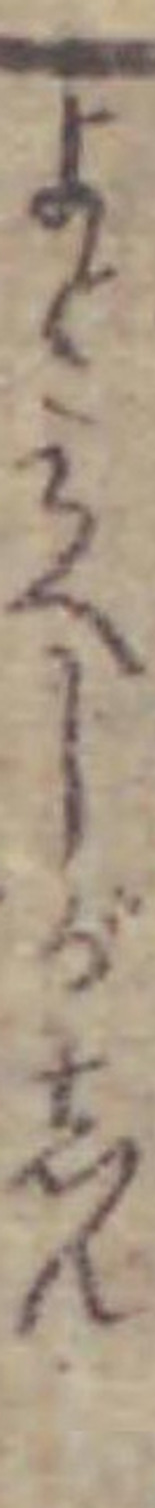にとみへしがしん
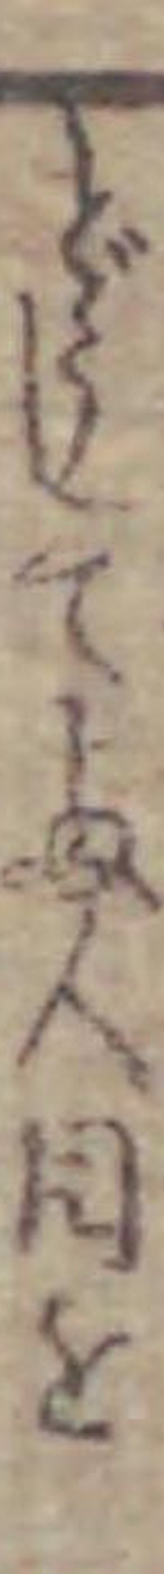どうして両人目を
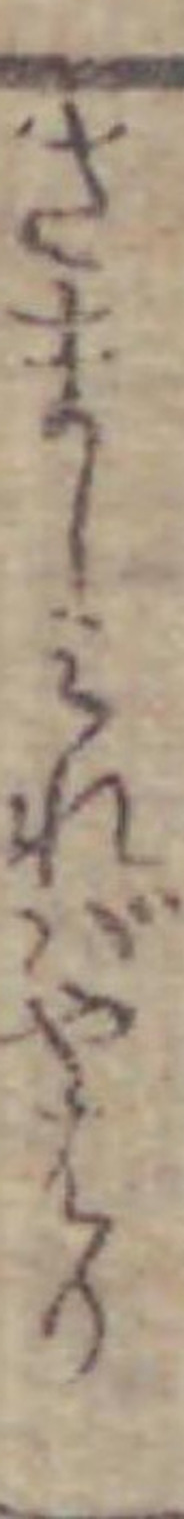さましみればやはり
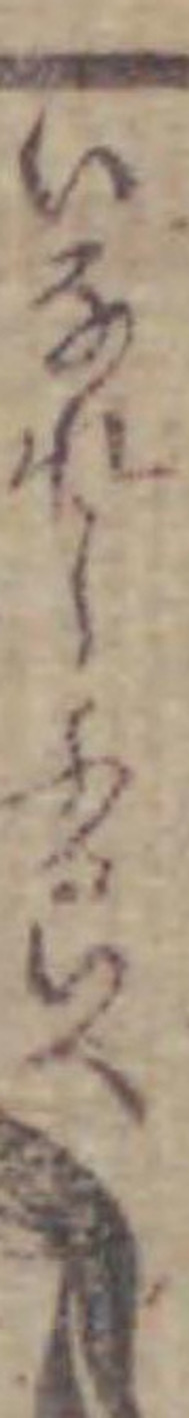いなれしふるいへ
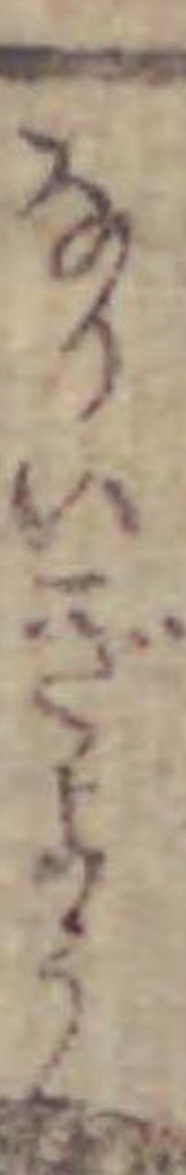なりいぎよう
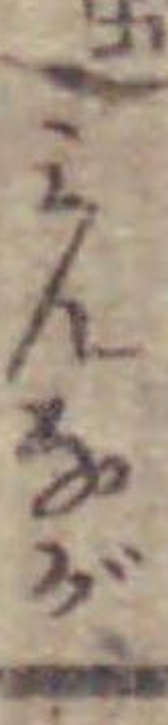みんなが
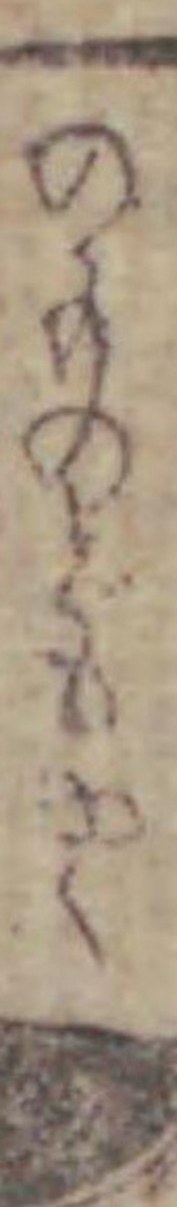のものどもやく
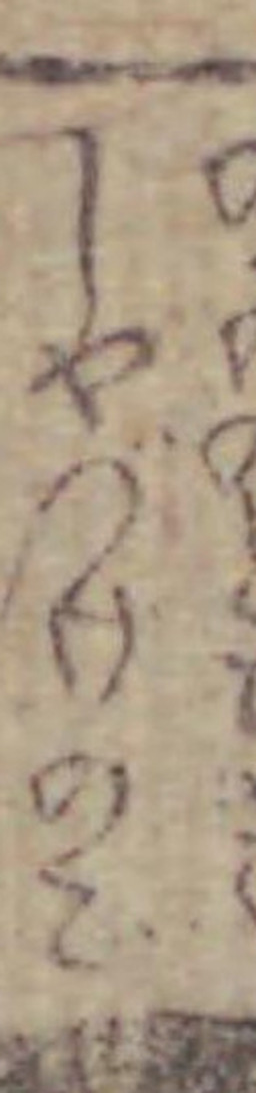しやづけのご
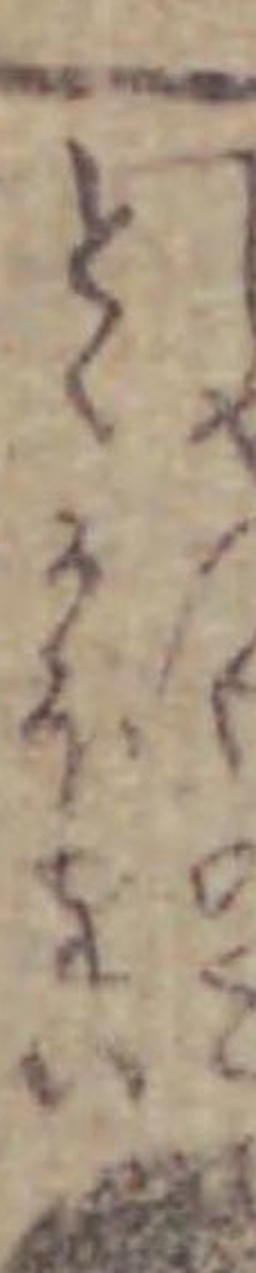とくかほをい
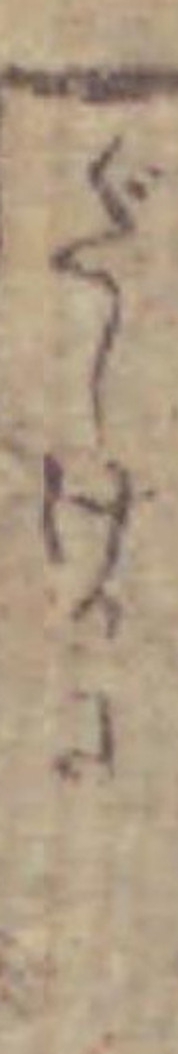だしけるに
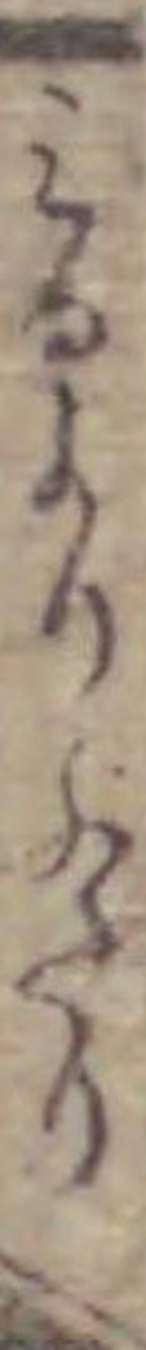みるよりふたり
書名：二日替 : 2巻
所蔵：国立国会図書館 National Diet Library, JAPAN
